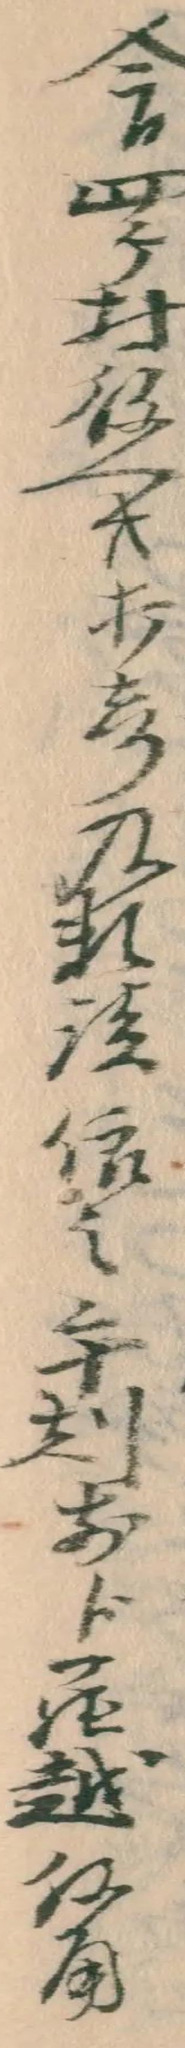今日四ヶ村役人共打寄及類談依之午刻前ゟ罷越何角
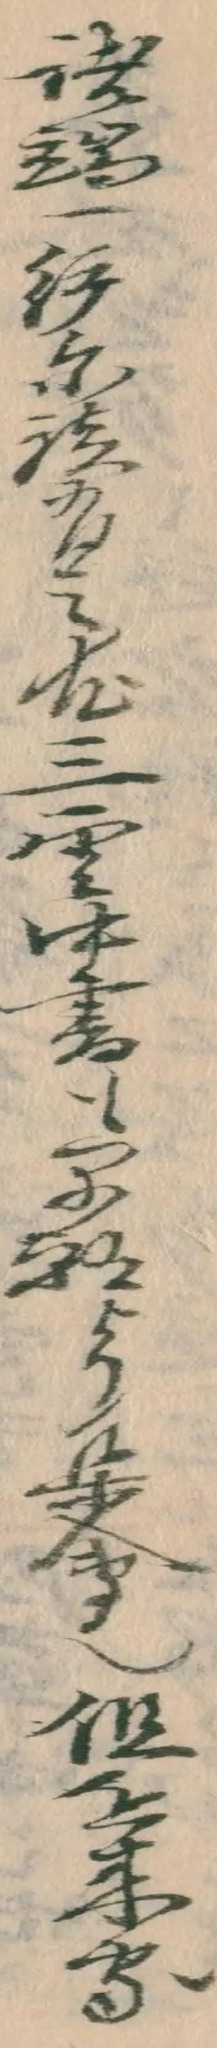諸端一統に談有之尤三雲中書も早朝より集會也但近来家
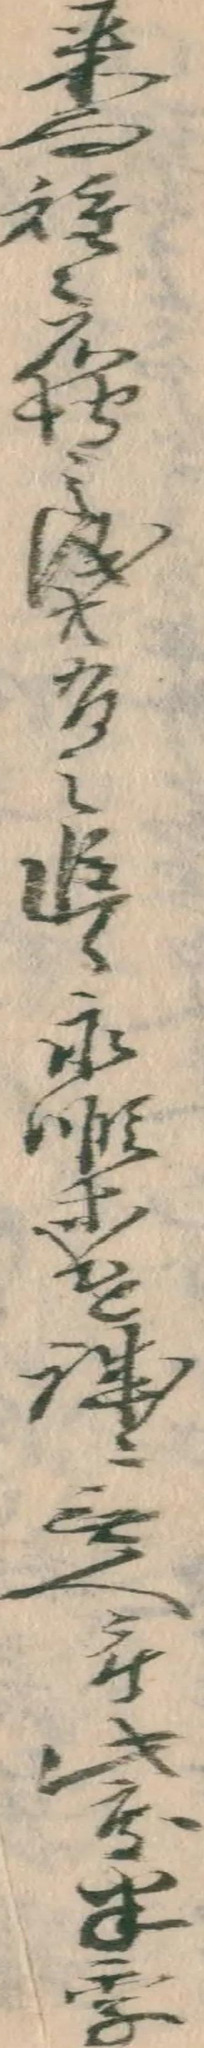来向種々不埒之儀共有之追々永暇等遣殊二無人ニ付此度半季
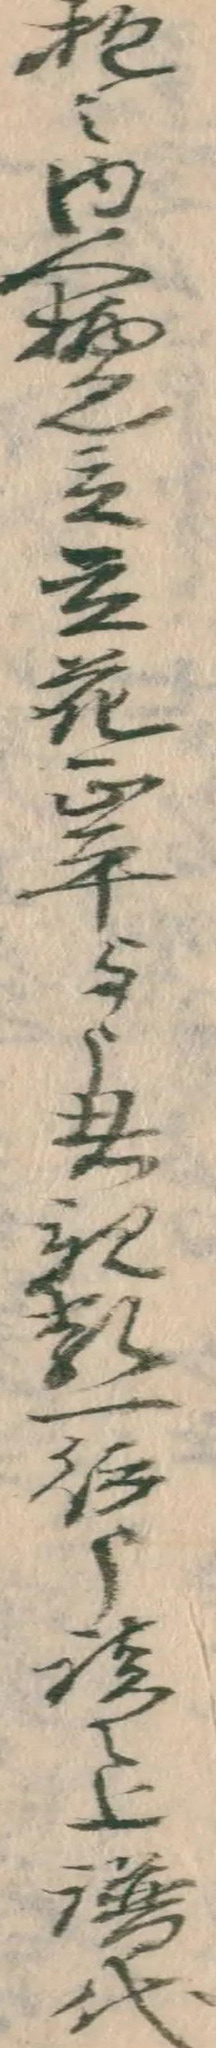抱之内人柄見立並花正平と申者親類一統申談之上譜代
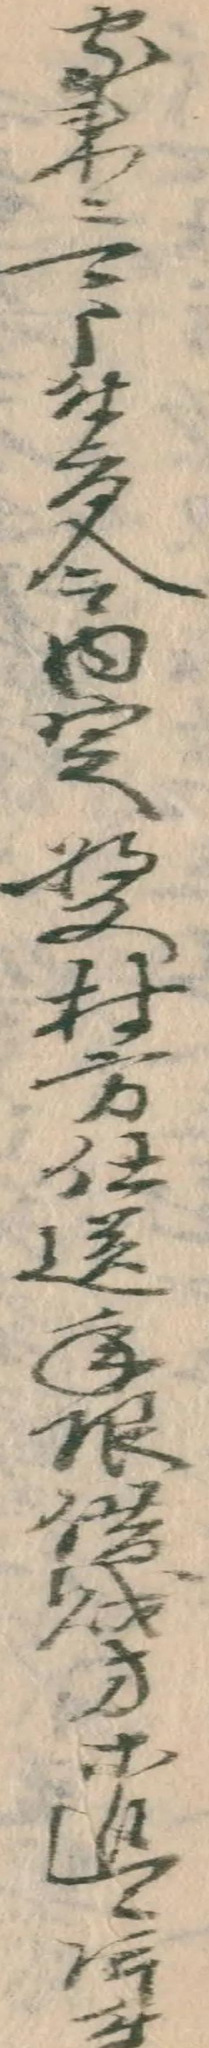家来ニ可申付旨令内定将又村方仕送年限借財方等追而片付
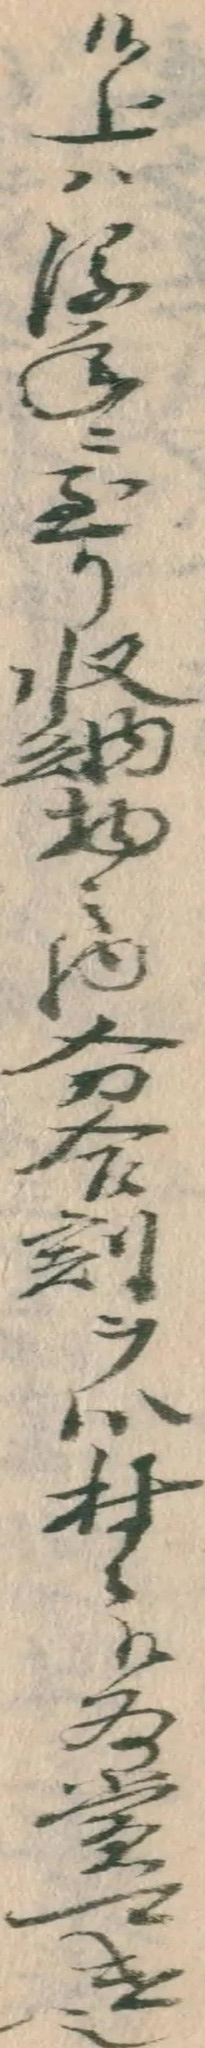候上ハ後年ニ至り収納物之内分合割ヲ以村々江為賞可遣也
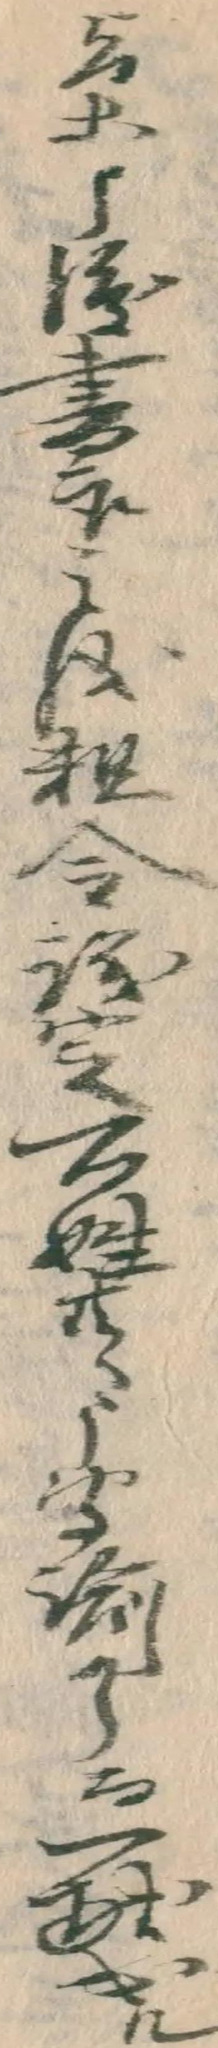旨等申渡書取之儀粗令評定百姓共へ申聞諭了而一献出ル
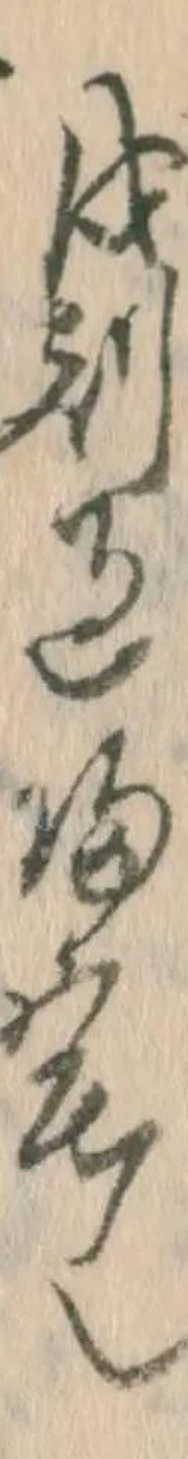戌刻過帰宅也
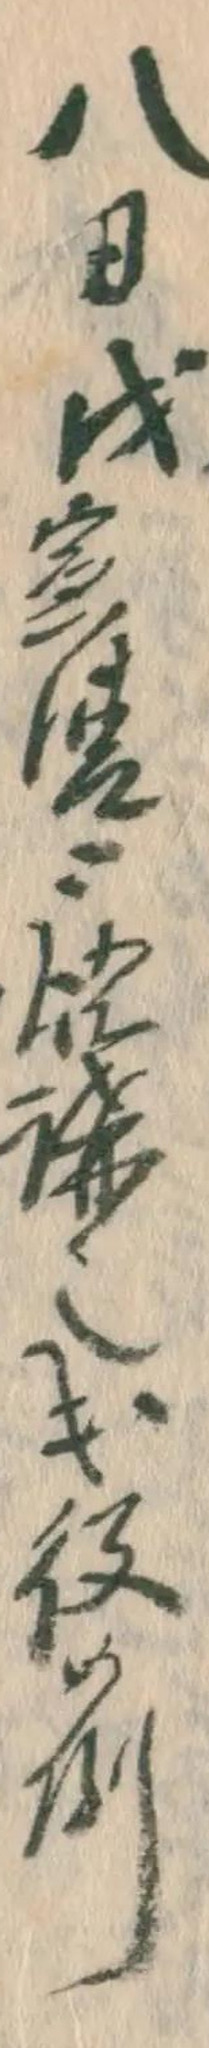八日戊寅晴御燈講也出役如例
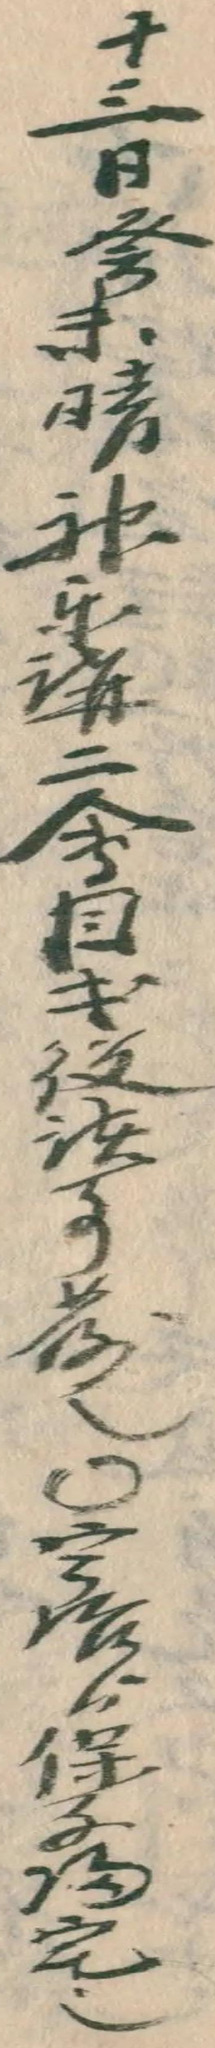十三日癸未晴神楽講二會目出役諸事如例也〇宇治ゟ保子帰宅也
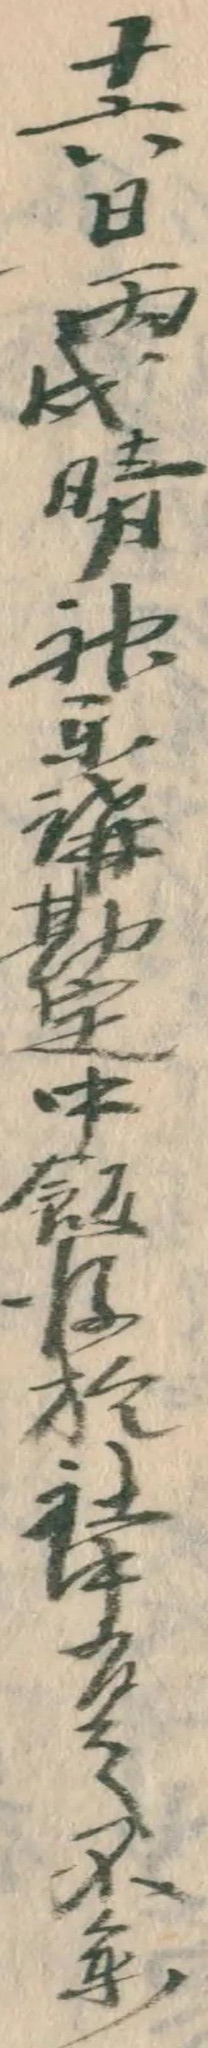十六日丙戌晴神楽講勘定中飯後於社中有之不参
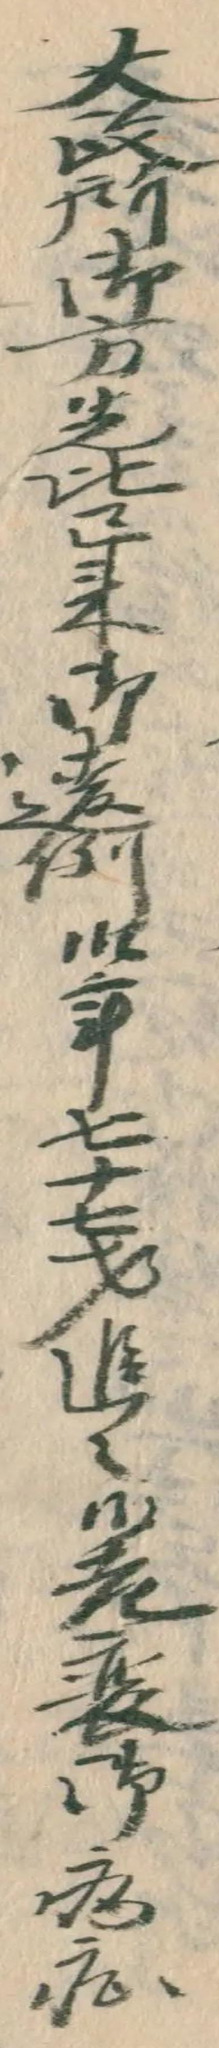大政所御方先比已来御違例御年七十七才追々御老衰御病症
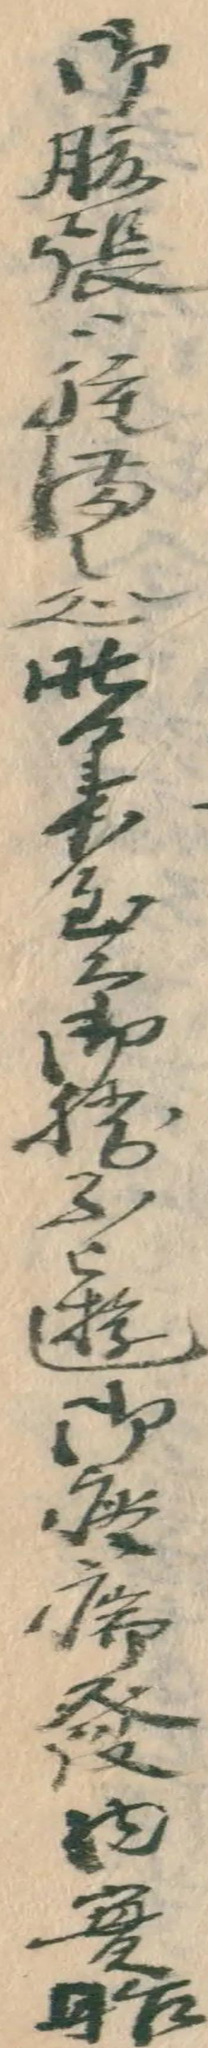御腹張御腫満之処昨日来至而御勝不被遊御發内實昨

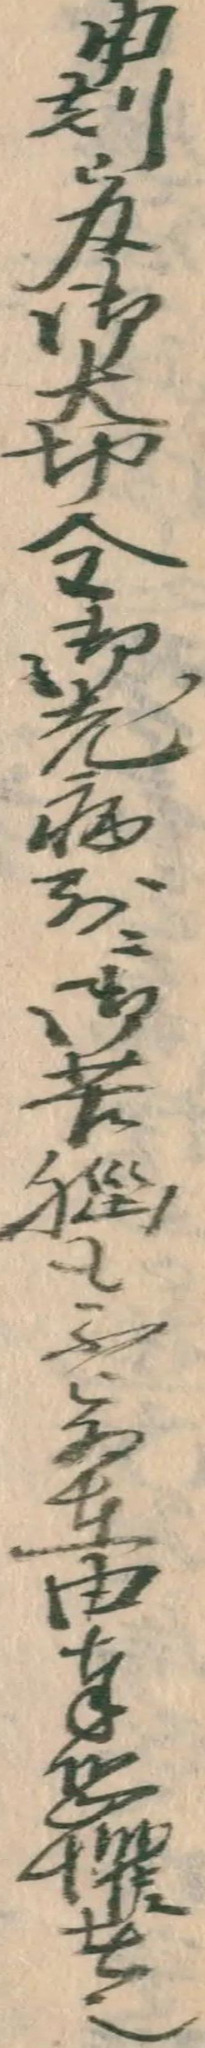申刻ニ及御大切全御老病前ニ御苦悩も不被為在由奉恐懼者也
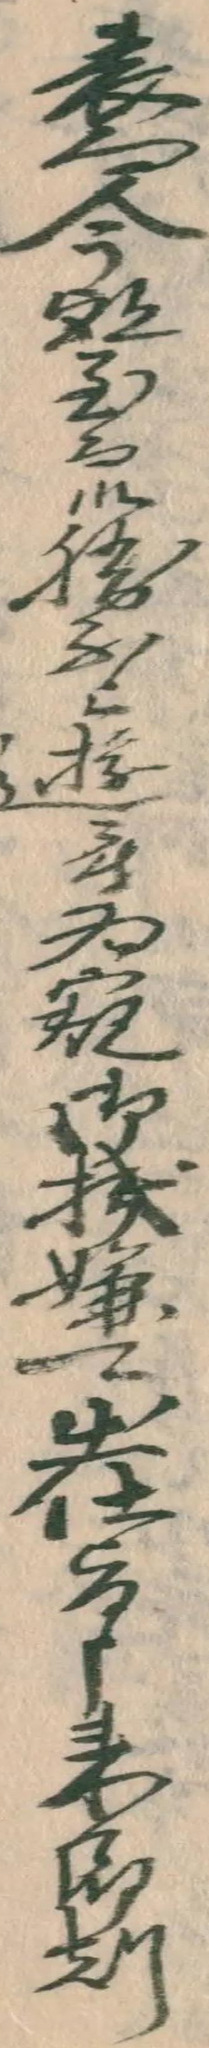表向今朝至而御勝不被遊ニ付為窺御機嫌可出仕旨申来即刻
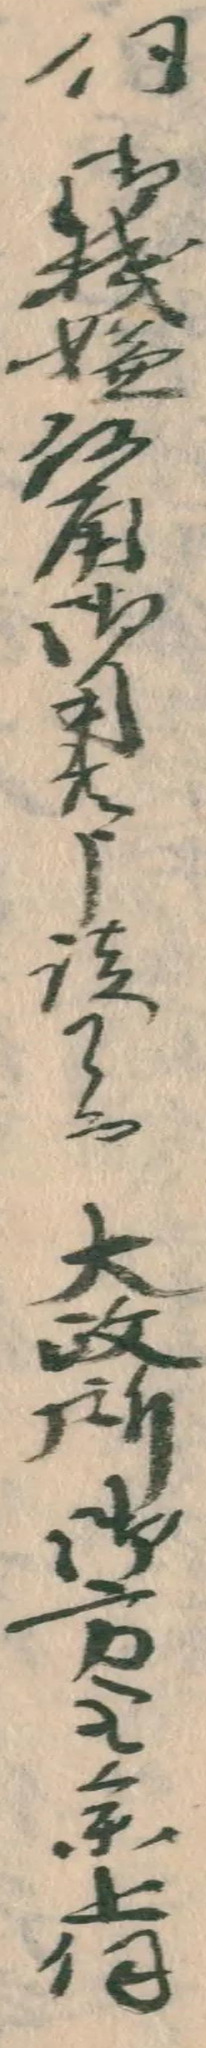伺御機嫌何角御用共申談了而大政所御方へも参上伺
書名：賀茂社記録. 第69冊
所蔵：国立国会図書館 National Diet Library, JAPAN
